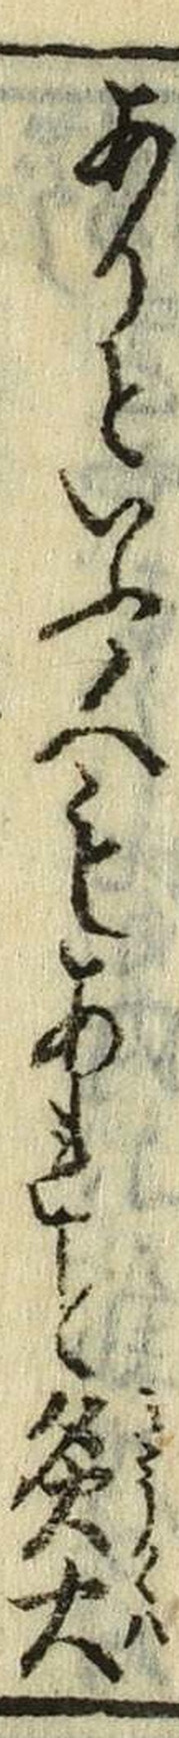ありといふ人のあれと灸火
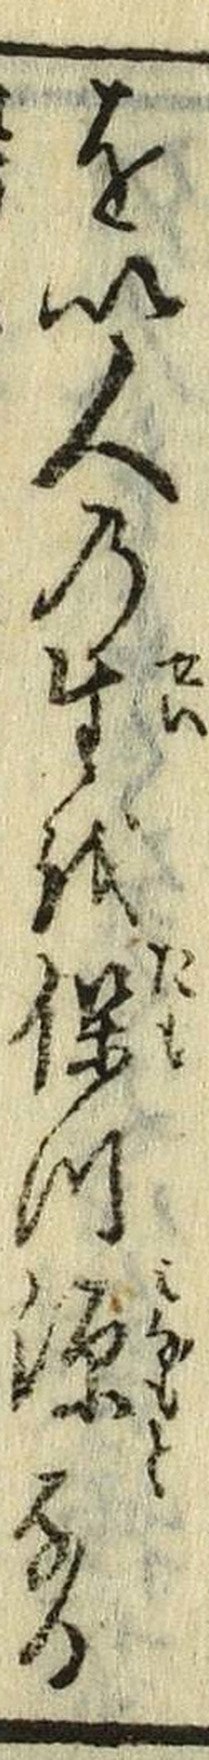を以人の生を保つ源なる
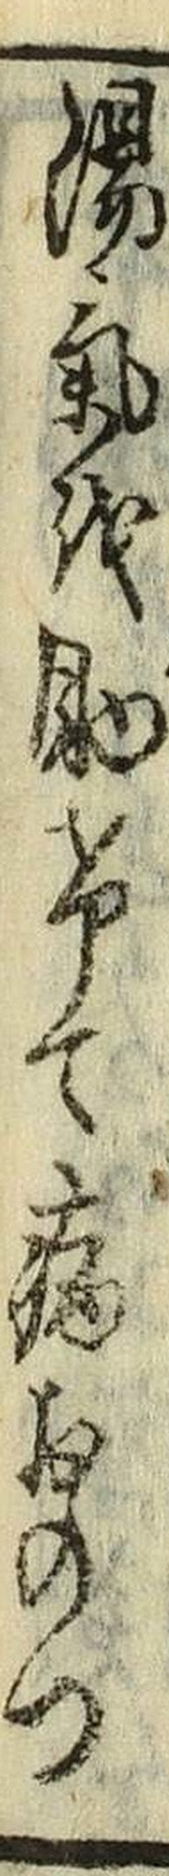陽気を助けて病おのつ
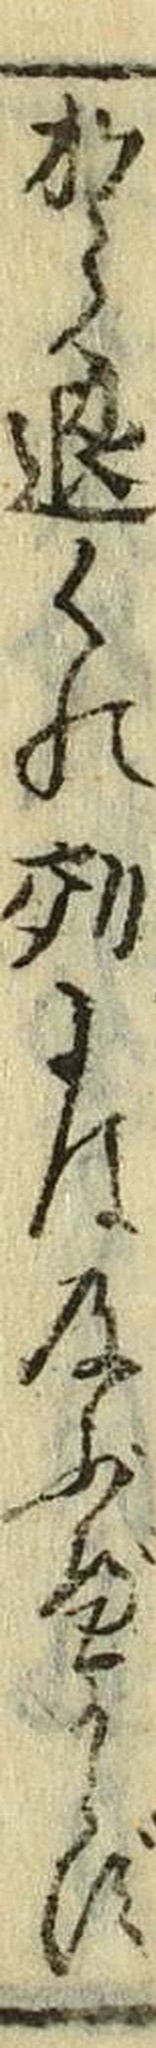から退くの効には及ぶべからず
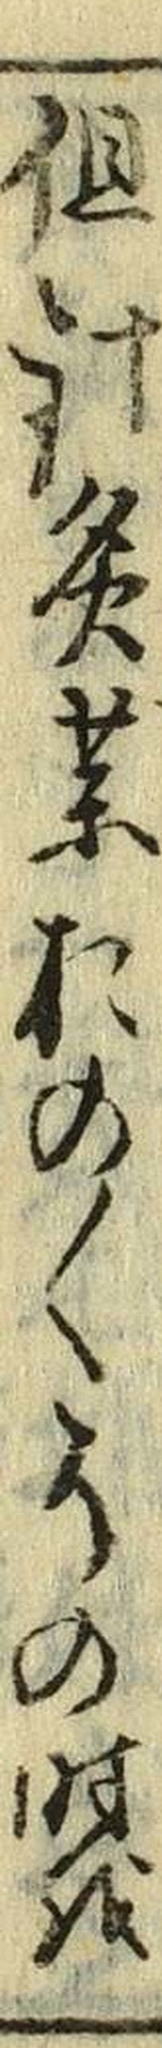但針灸薬おの〳〵その時を
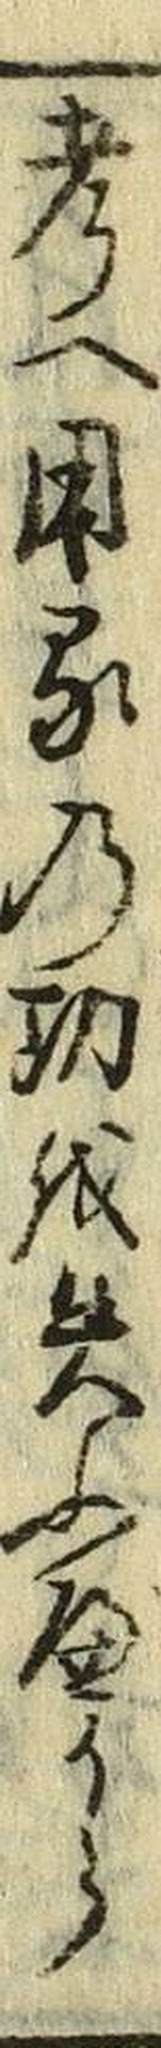考へ用るの功を失ふべから
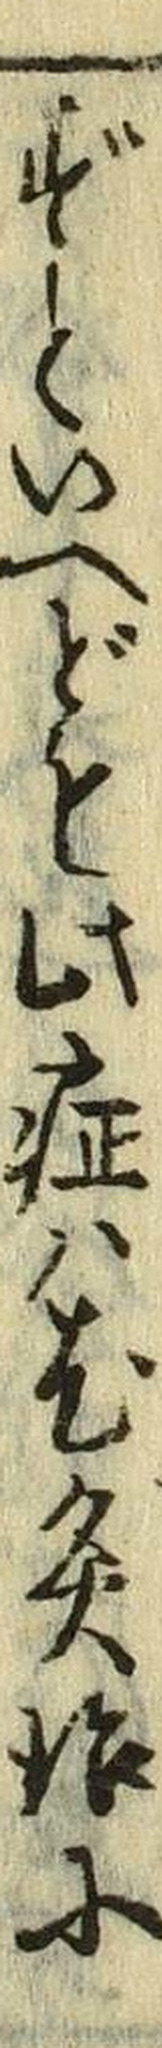ずといへども症は尤灸治に
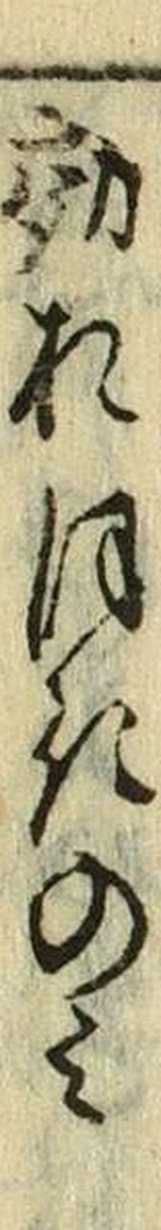効おほきのみ
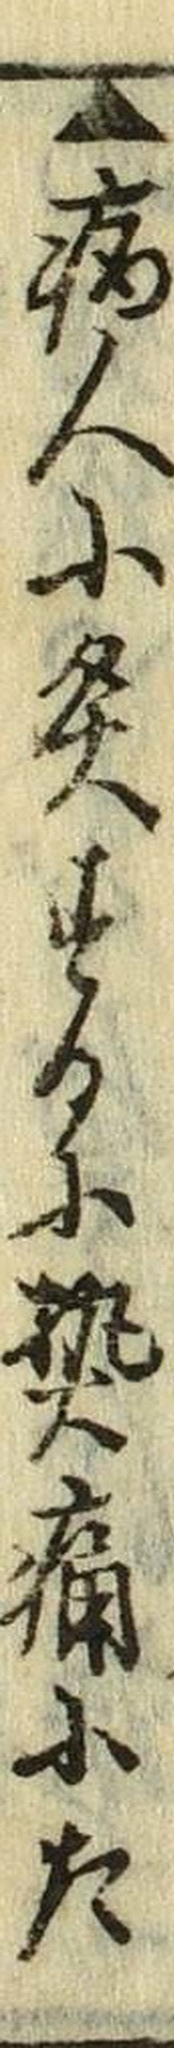▲病人に灸するに熱痛にた
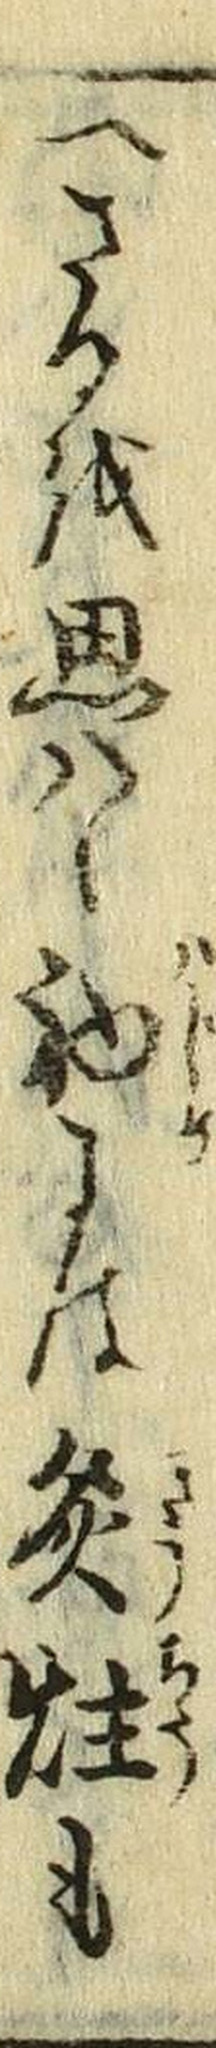へさるを思はゝ初には灸炷も
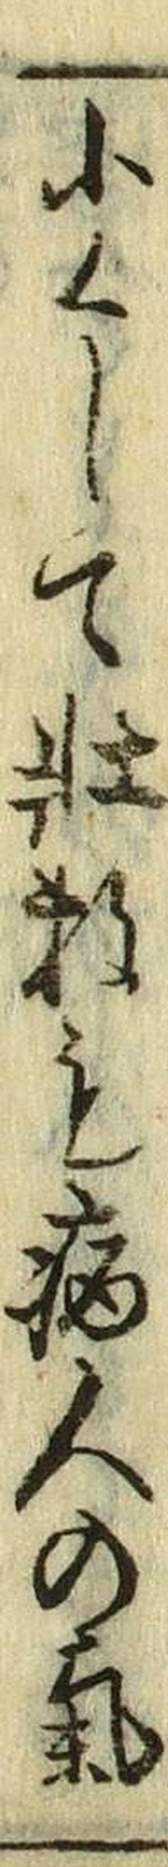小くして壮数も病人の気
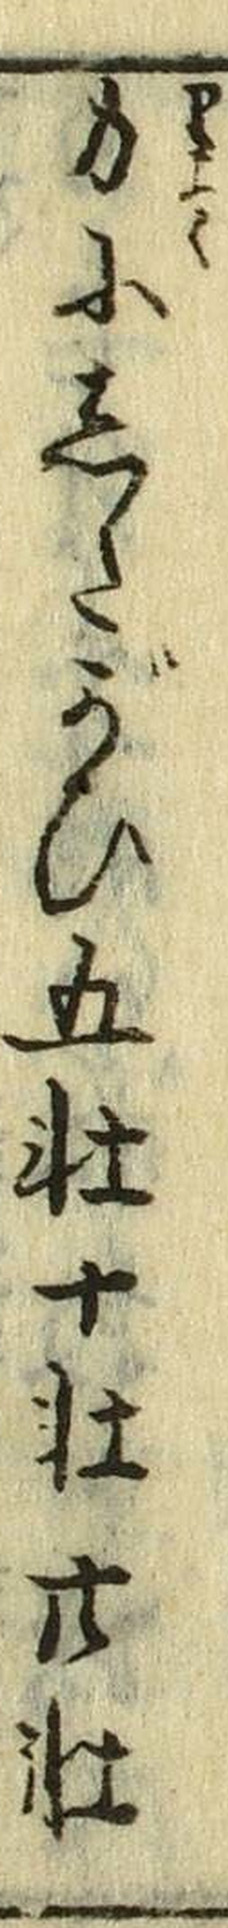力にしたがひ五壮十壮廿壮
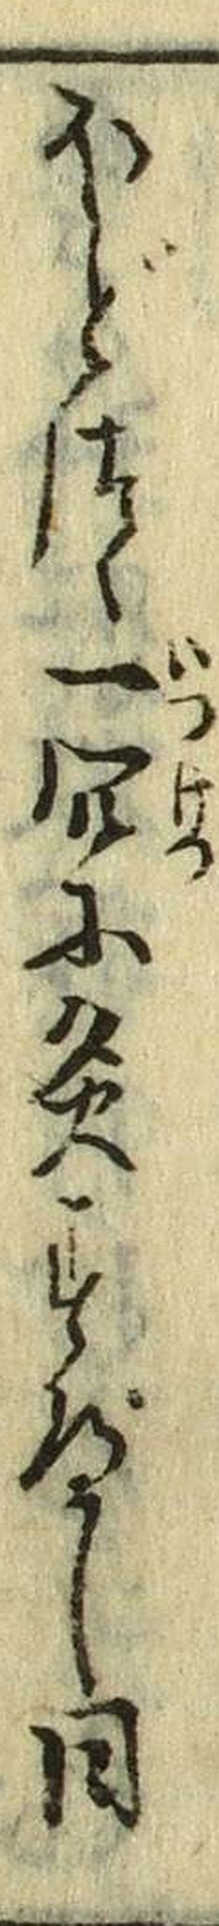ほどつゝ一穴に灸すべし同
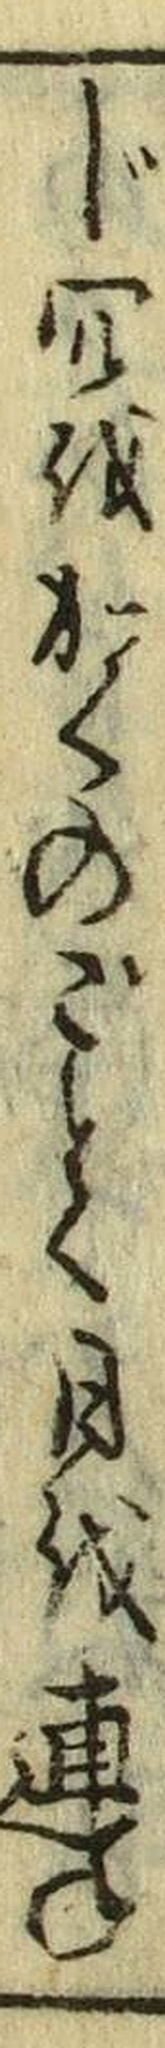じ穴をかくのごとく日を連ね

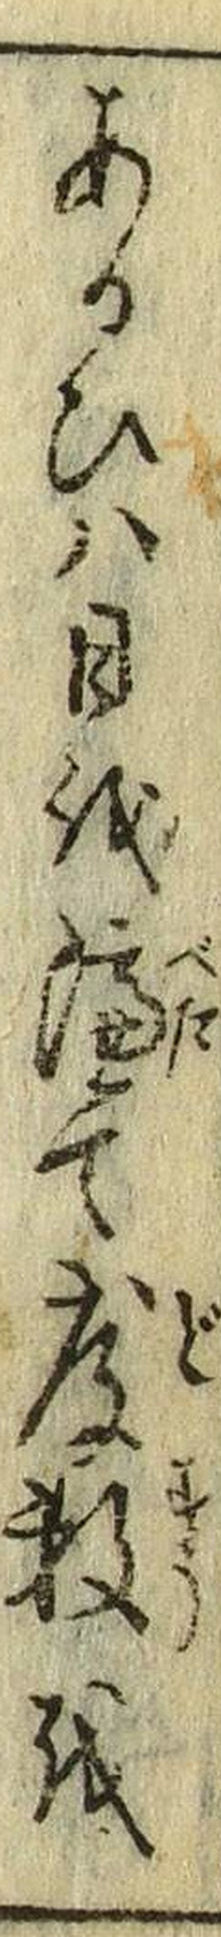あるひは日を隔て度数を
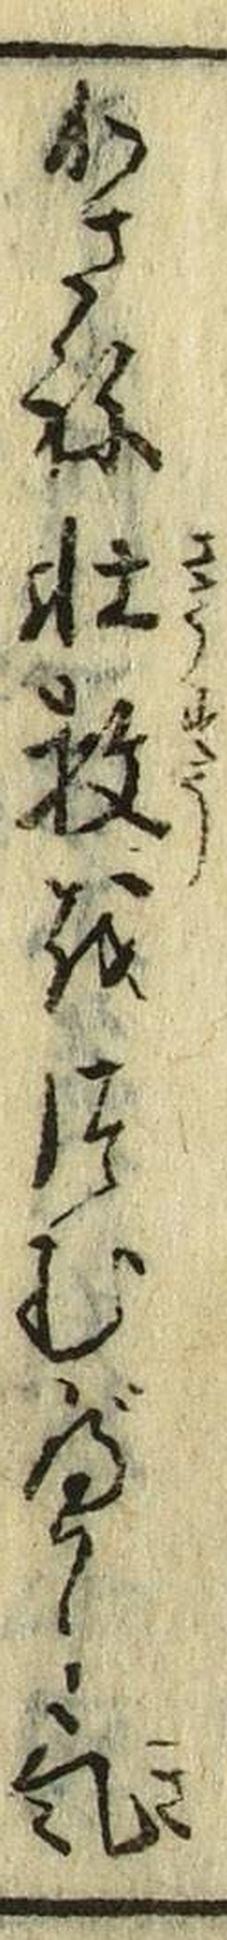かさね壮数をつむべし気
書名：居家養生記
